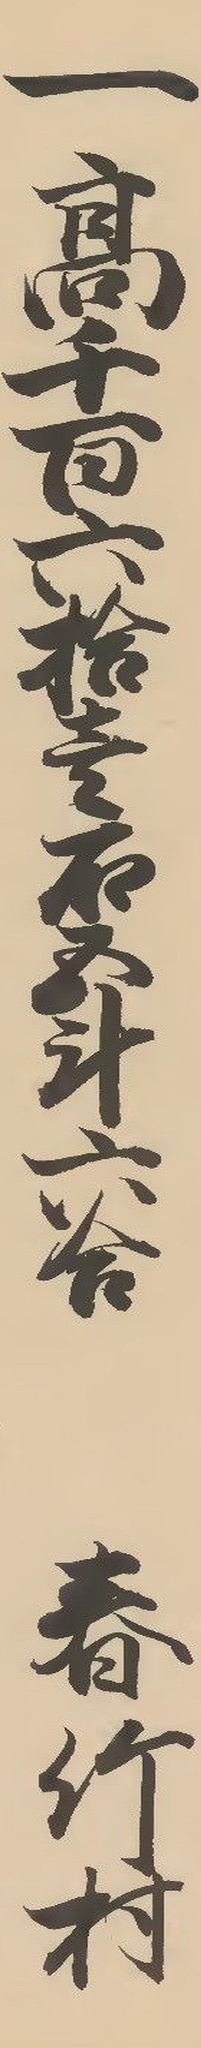一髙千百六拾壱石五斗六合春竹村
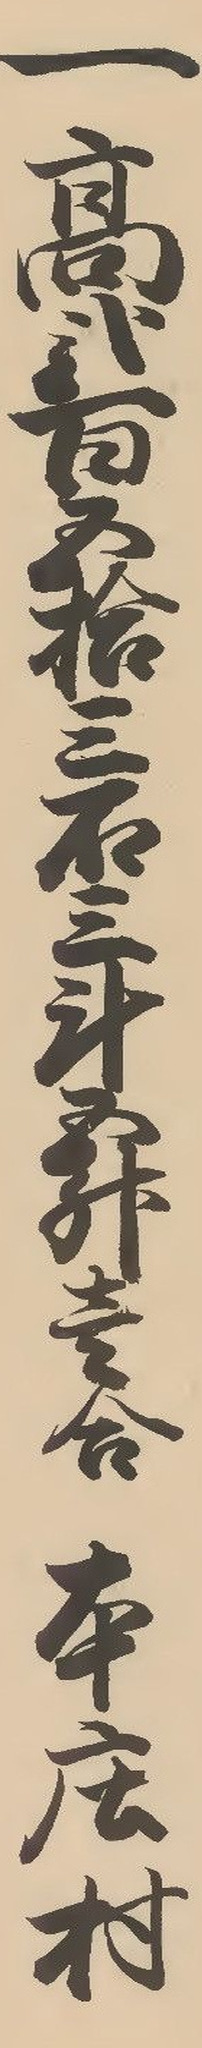一髙弐百五拾三石三斗五升壱合本庄村
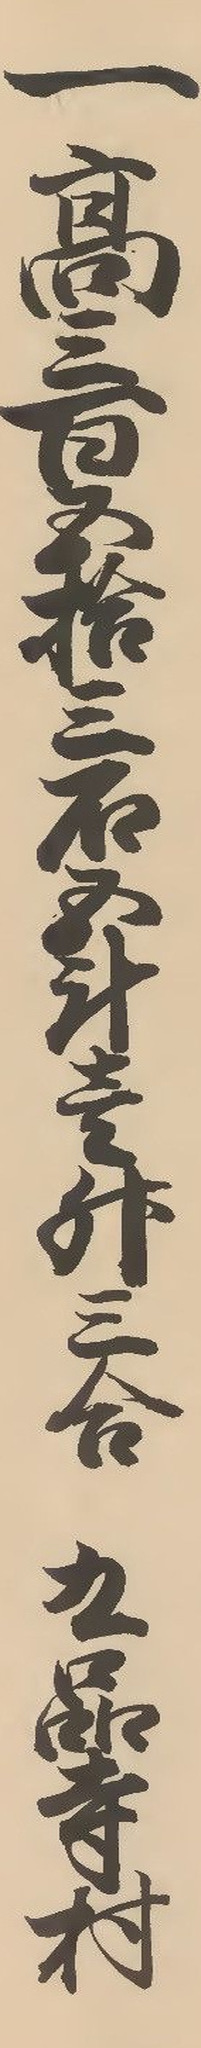一髙三百五拾三石五斗壱升三合九品寺村
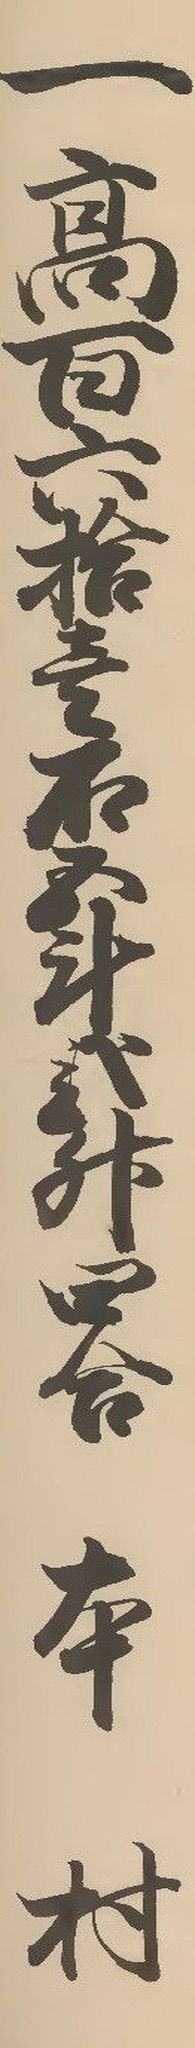一髙百六拾壱石五斗弐升四合本村
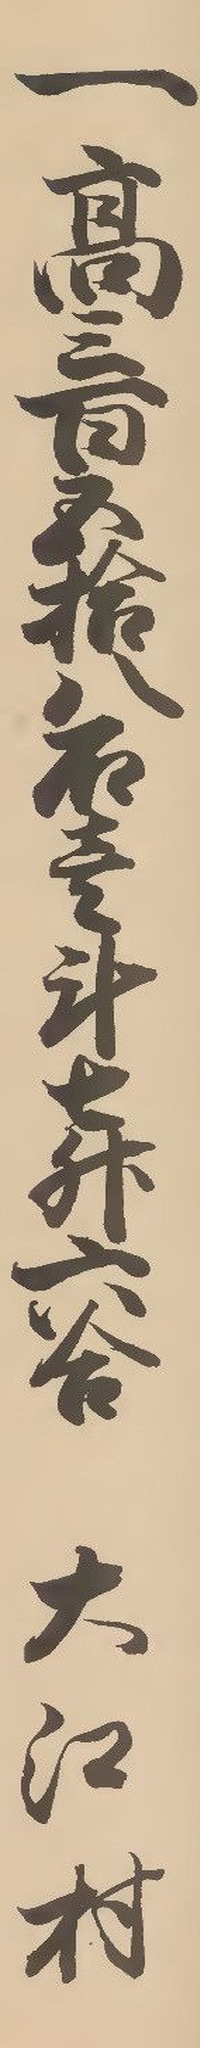一髙三百五拾八石壱斗七升六合大江村
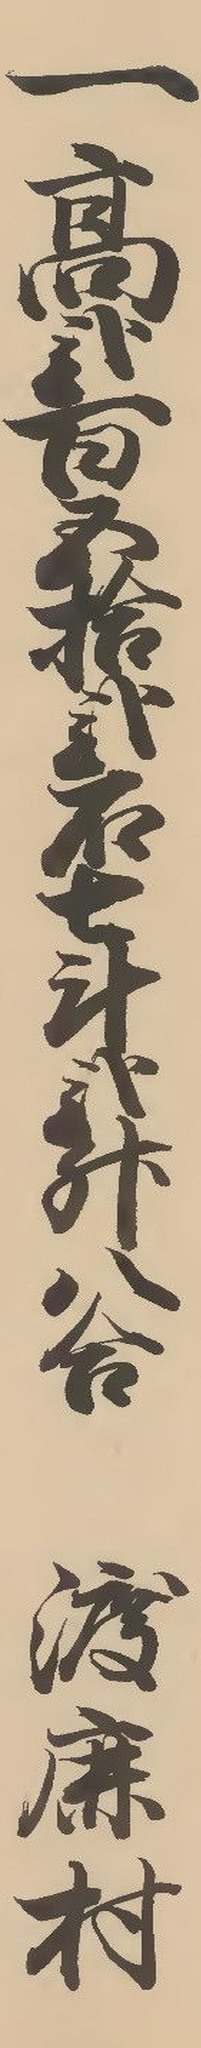一髙弐百五拾弐石七斗弐升八合渡鹿村
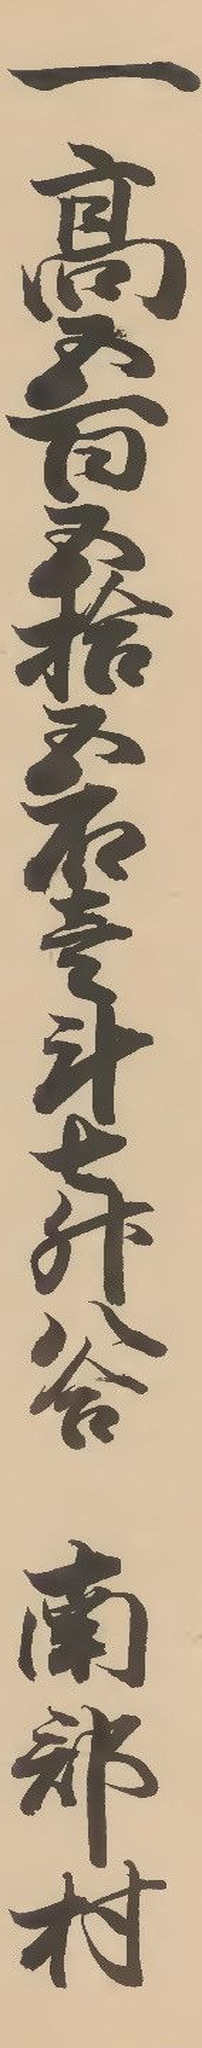一髙五百五拾五石壱斗七升八合南部村
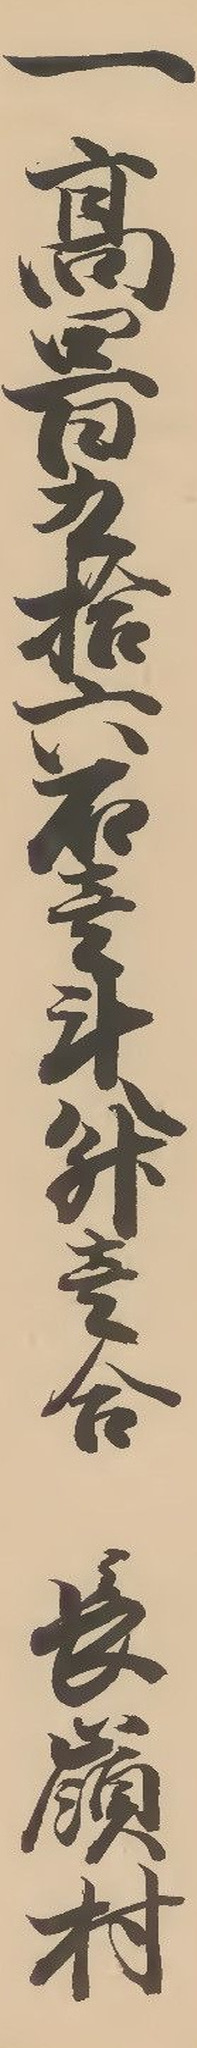一髙四百九拾六石壱斗八升壱合長嶺村

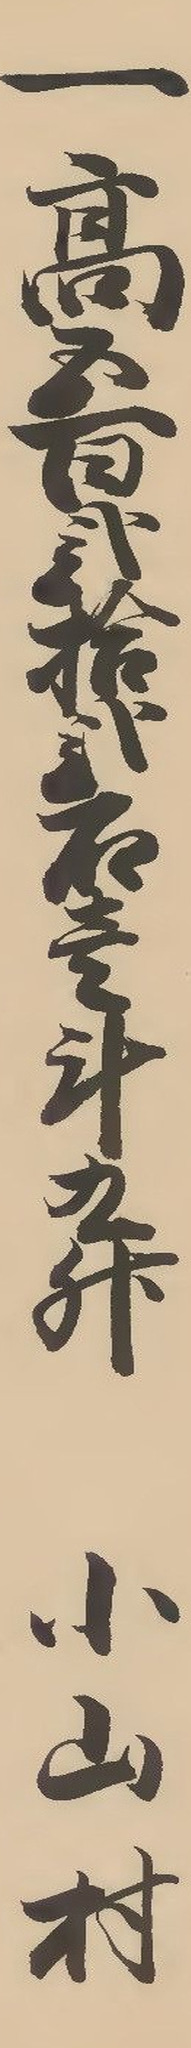一髙五百弐拾弐石壱斗九升小山村
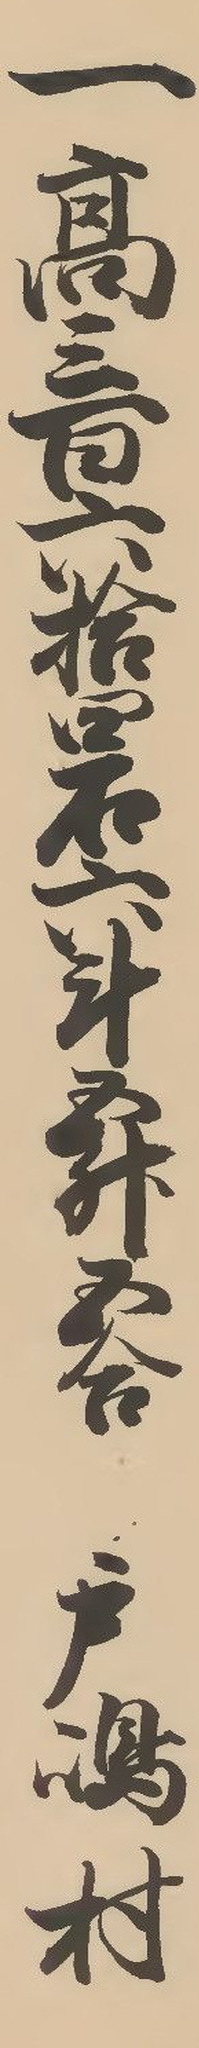一髙三百六拾四石六斗五升五合戸嶋村
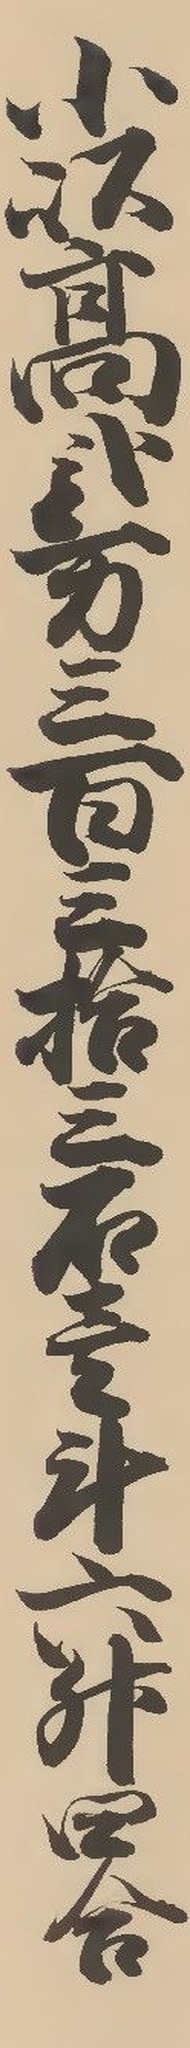小以髙弐万三百三拾三石壱斗六升四合
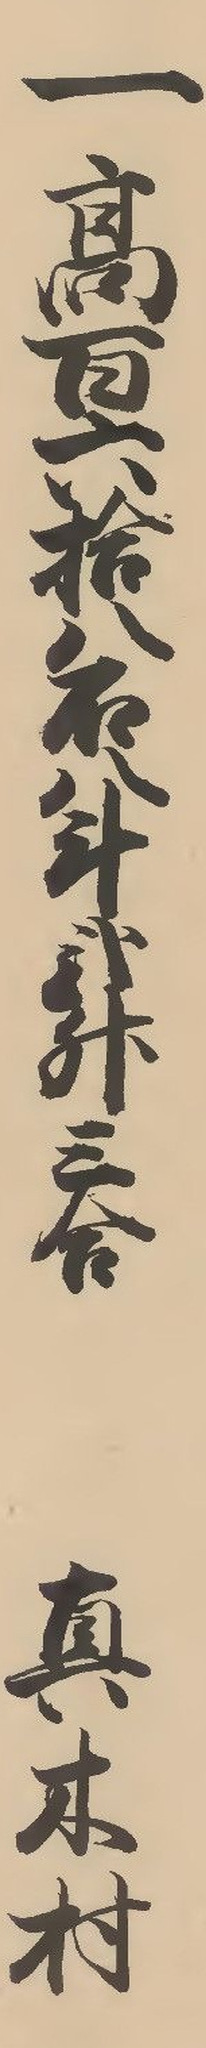一髙百六拾八石八斗弐升三合真木村
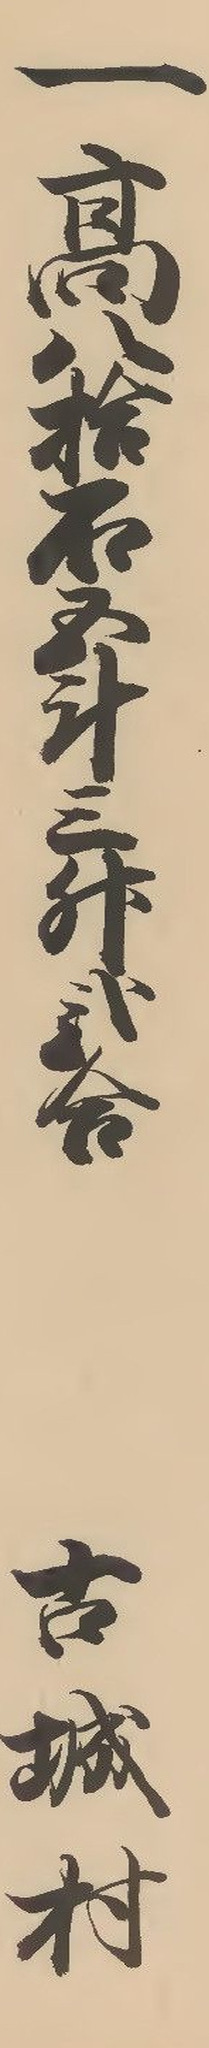一髙八拾石五斗三升弐合古城村
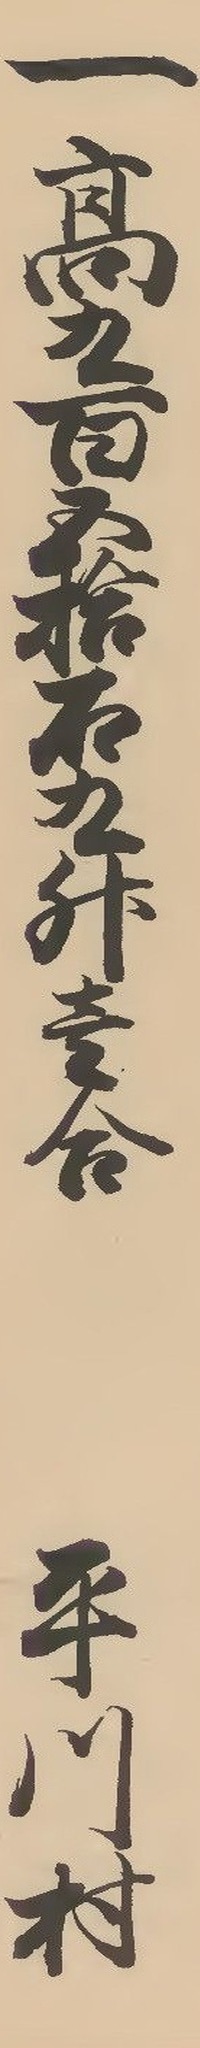一髙九百五拾石九升壱合平川村

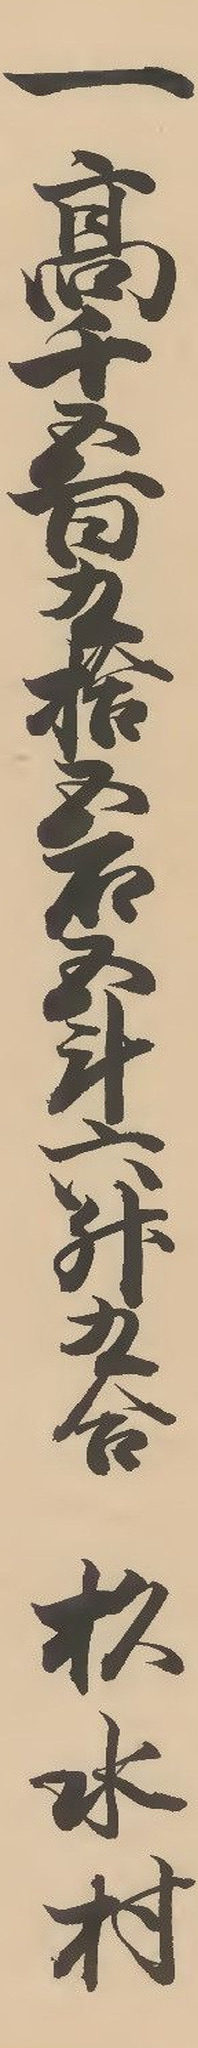一髙千五百九拾五石五斗六升九合杦水村
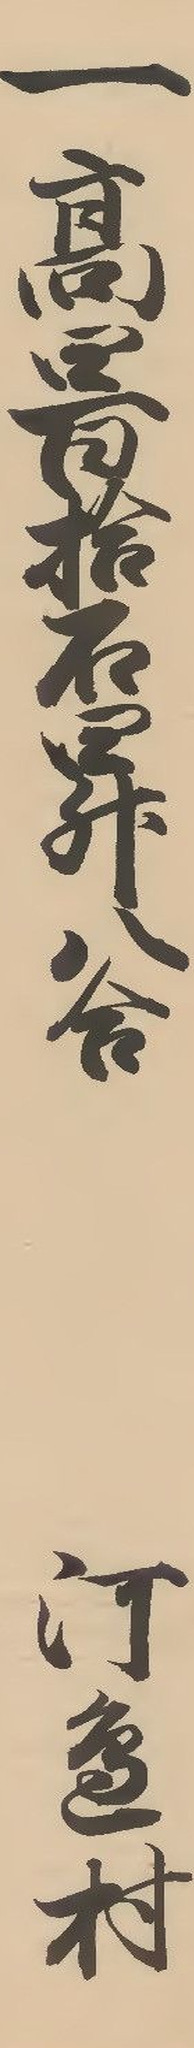一髙四百拾石四升八合河辺村
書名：肥後国郷帳
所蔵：国立公文書館 National Archives of Japan
